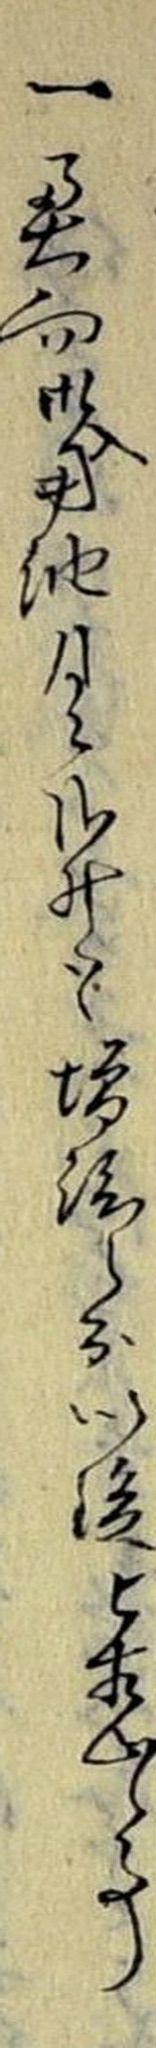一奥向御用油月々弐升つヽ増渡之分以後被相止候事
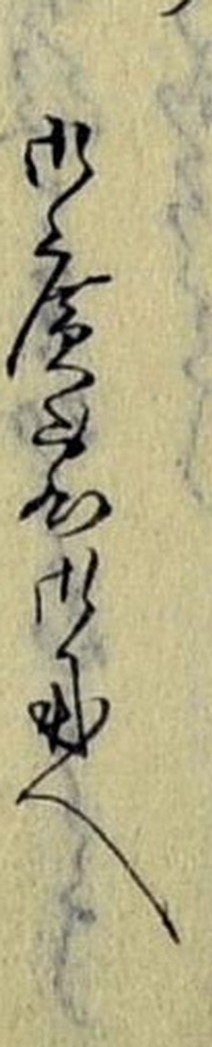御広敷御用人
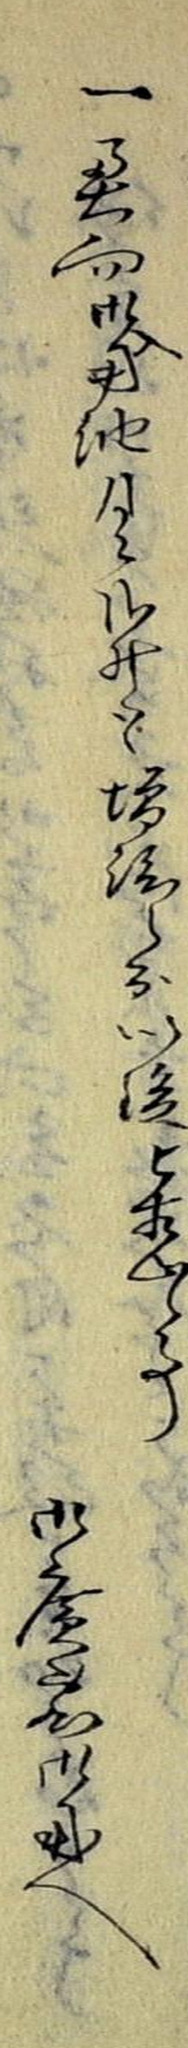一奥向御用油月々弐升つヽ増渡之分以後被相止候事
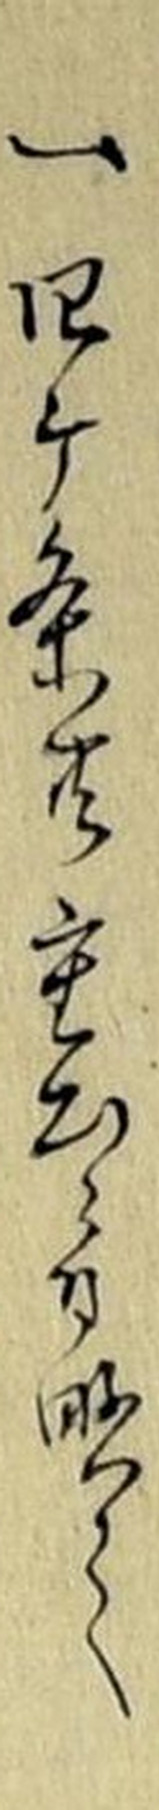一四ヶ条共重出に付略之
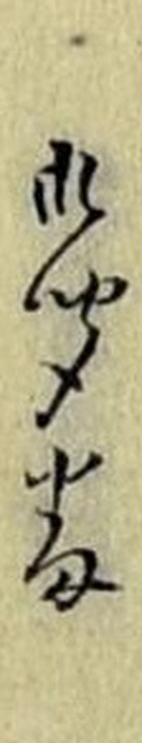御聞番
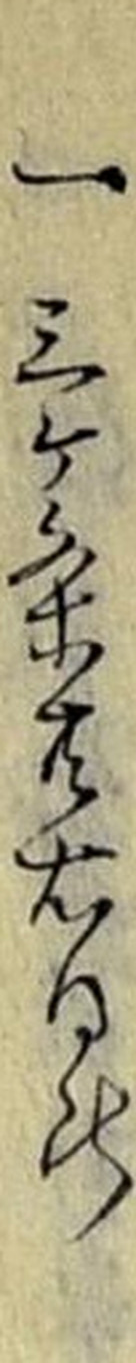一三ヶ条共右同断
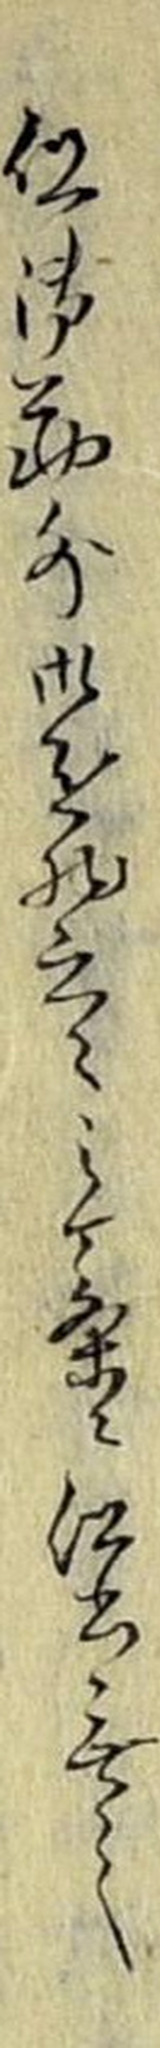但御勤外御進物云々之ヶ条被仰出無之
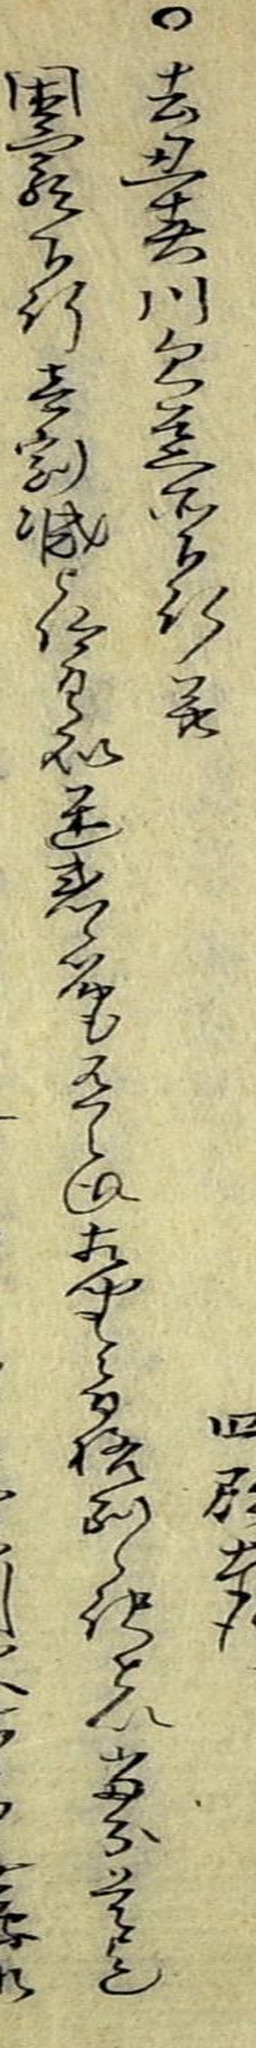困窮下行壱割減被仰付候処迷惑之筋も有之趣相聞候に付各別之訳を以当分是迄
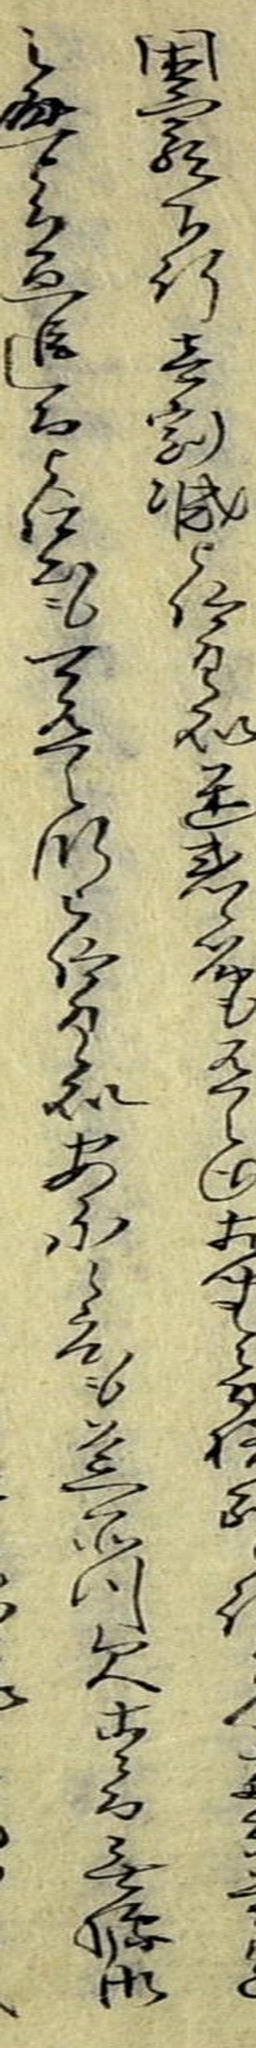之通被下置追而被仰出も可有之段被仰付候処安永之度も荒所川欠等に而無拠御
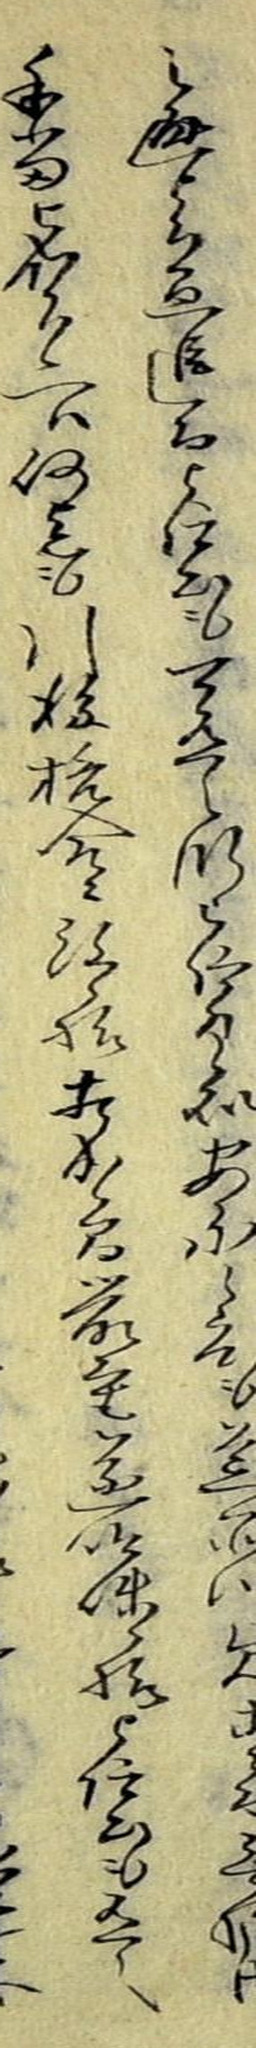手当被成下候へは何とも引移格合に致候様相成候間厳重遂吟味候様被仰出も有之
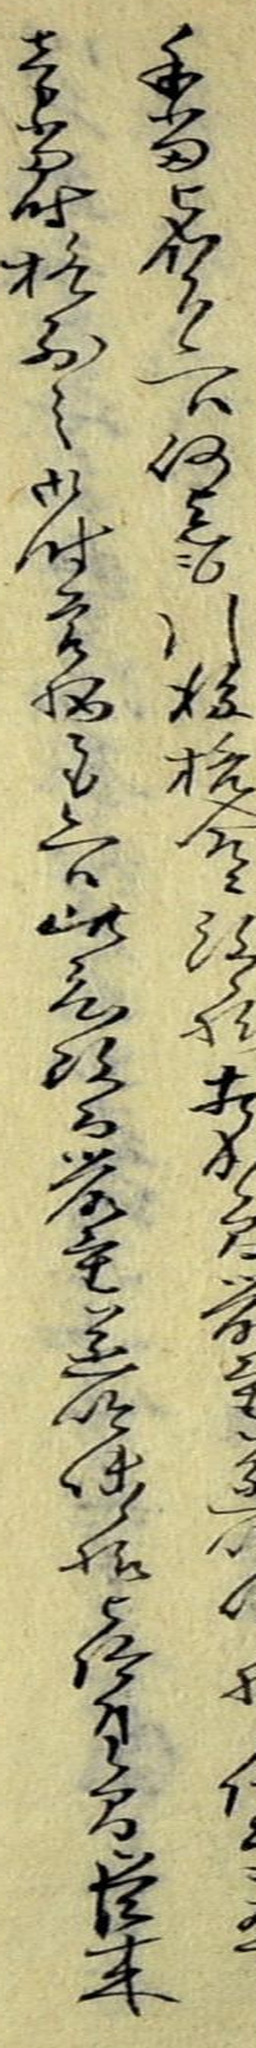旁当時各別之御時節柄にも候へは此度改而厳重遂吟味候様被仰付候間従來

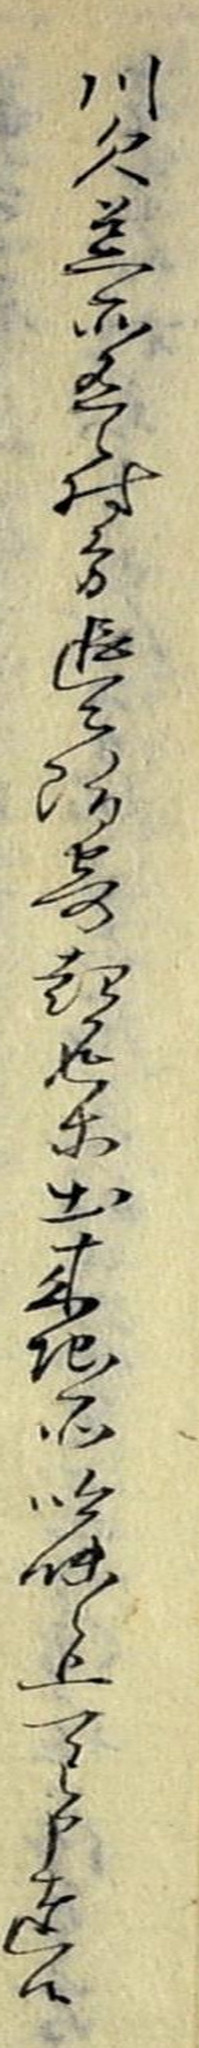川欠荒所有候村方追々附寄起返等出来地所吟味之上可被申達候
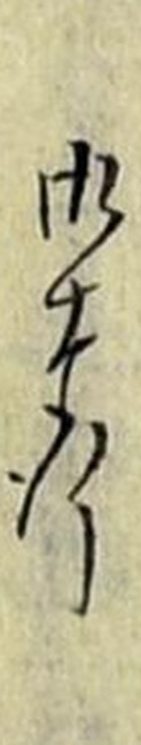御奉行
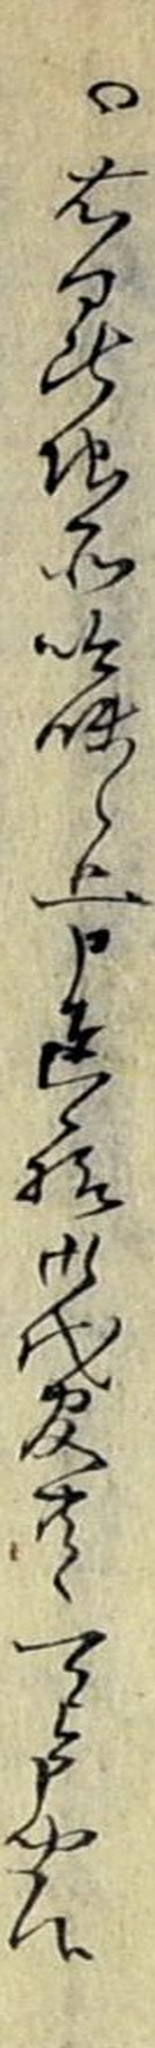○右同断地所吟味之上申達候様御代官共へ可被申聞候
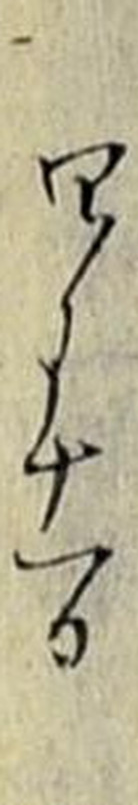四月十一日
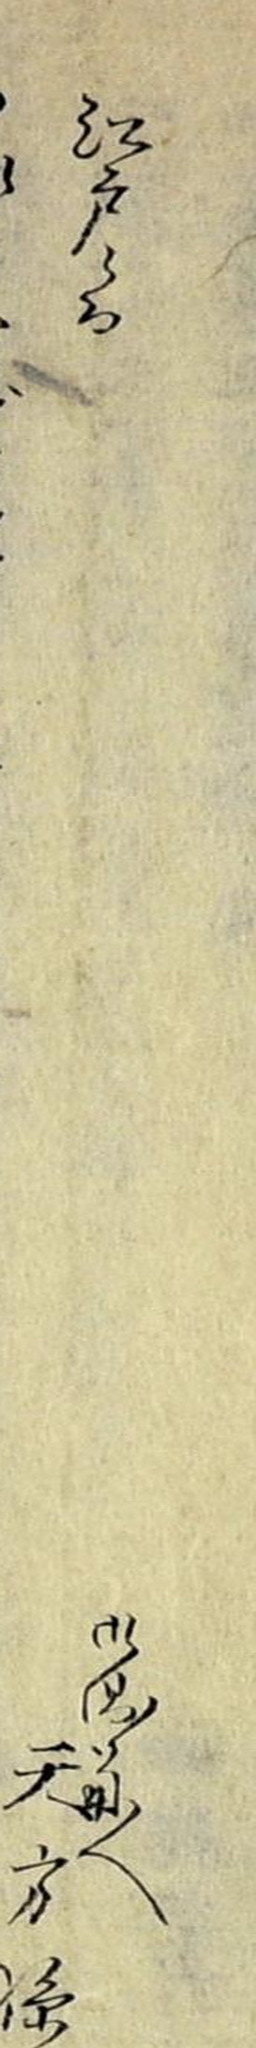江戸に而御広敷御用人
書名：命令之部 六
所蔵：福井県文書館 Fukui Prefectural Archives
